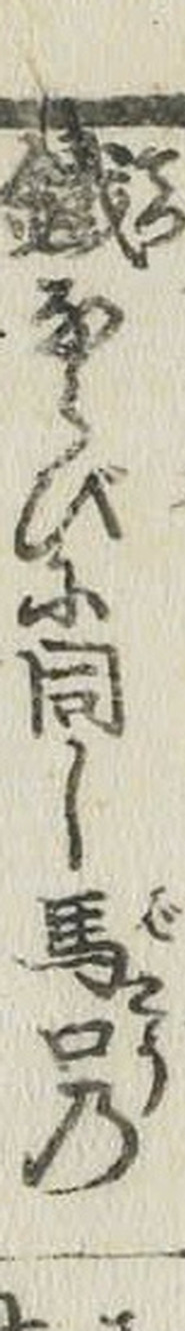鉄ならびに同し馬口の
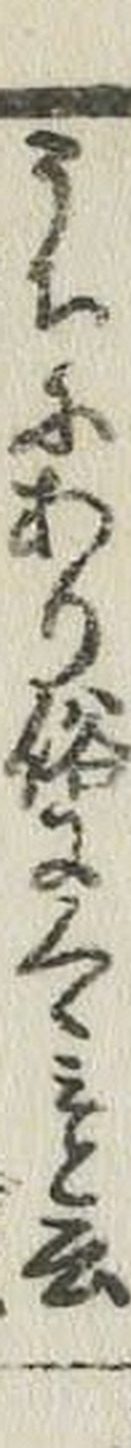うちにあり俗にくゝみと云
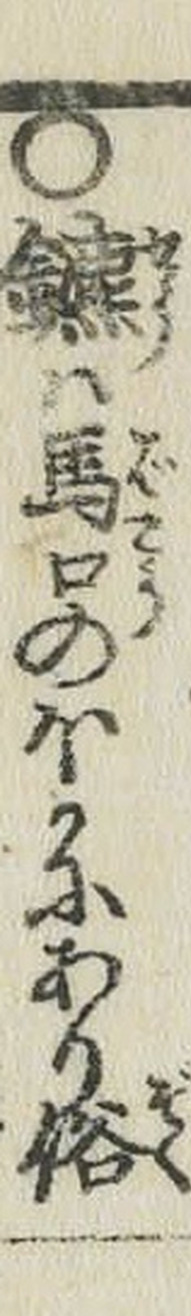○鑣は馬口のほかにあり俗
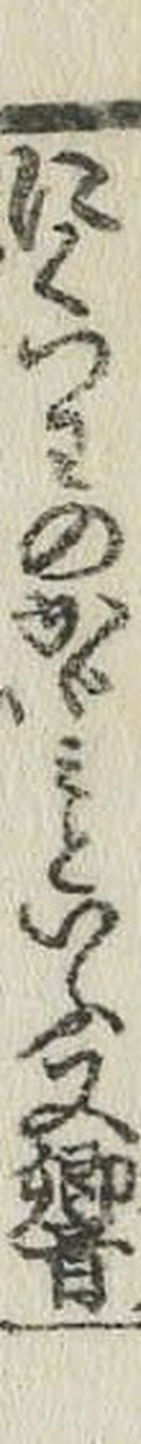にくつわのかゞみといふ又響
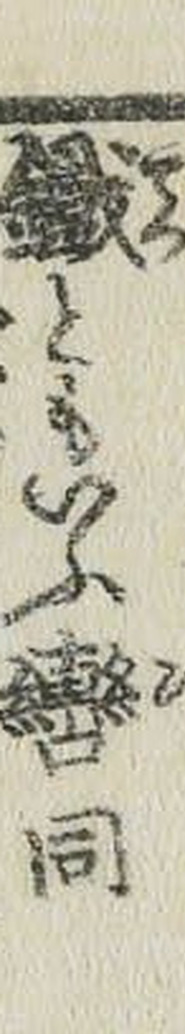鉄ともいふ轡同
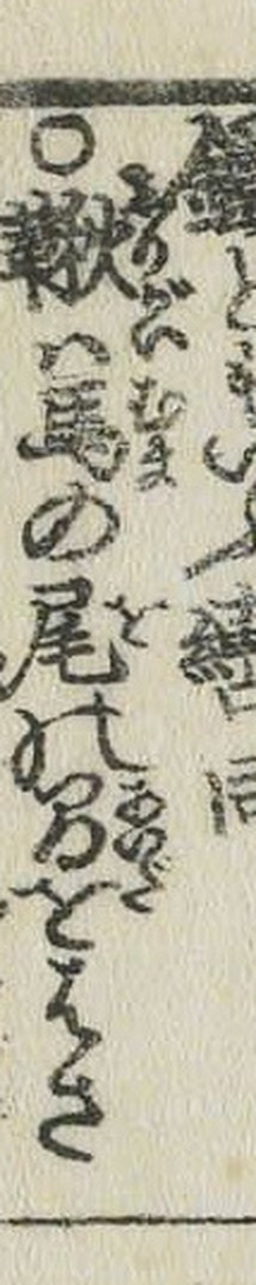○鞦は馬の尾の間をはさ
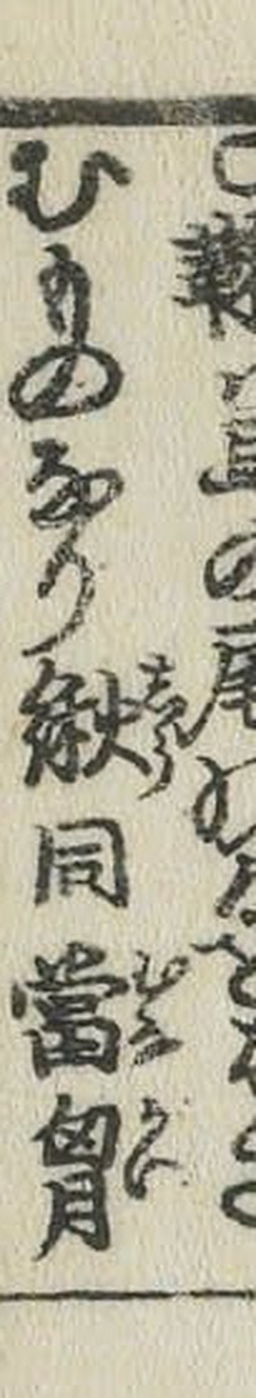むものなり䋺同当胷

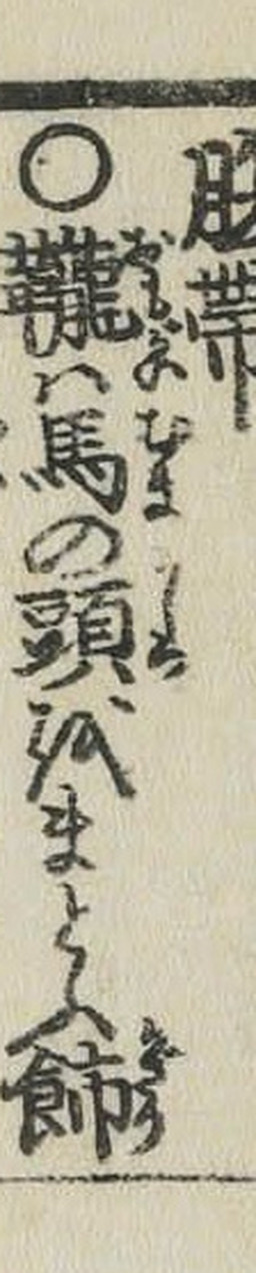○䪊は馬の頭をまとふ飾
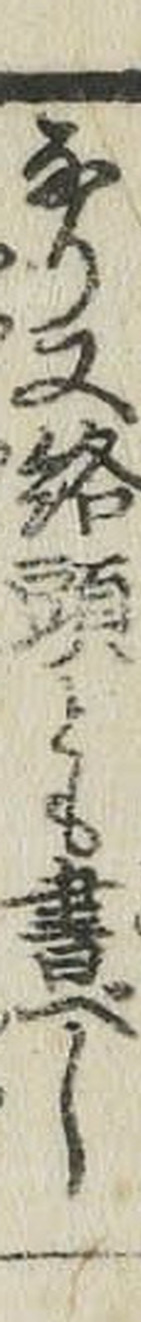なり又絡頭とも書べし
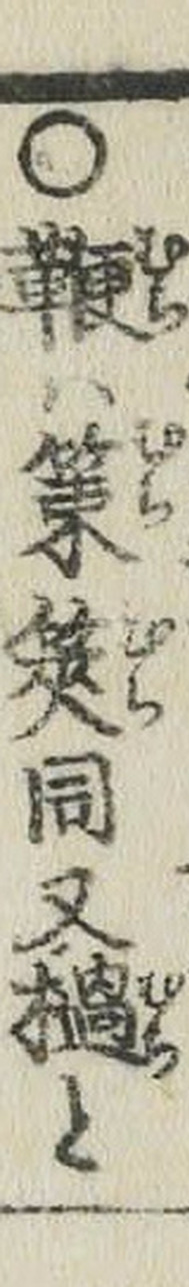○鞭は策筴同又檛と
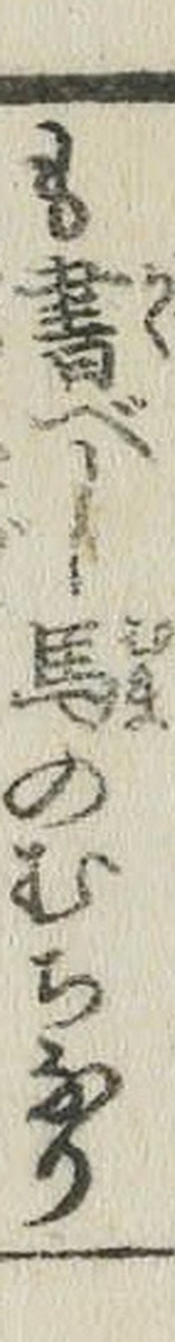も書べし馬のむちなり
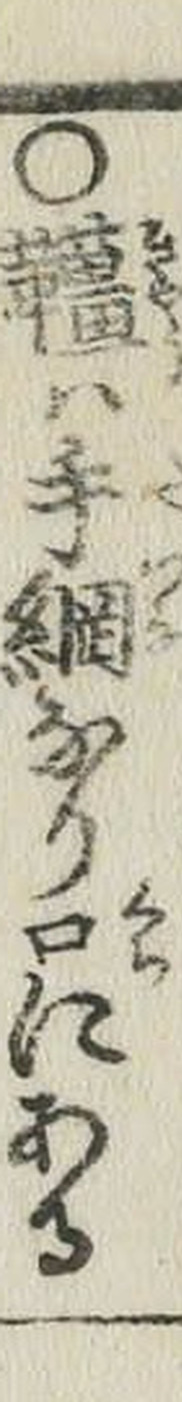○韁は手綱なり口にある
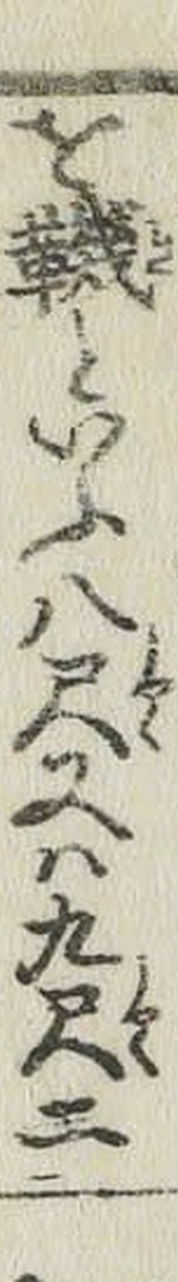を鞿といふ八尺又は九尺二
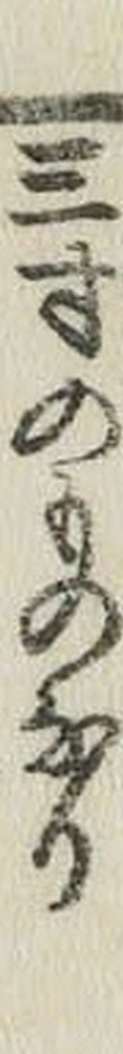三寸のものなり
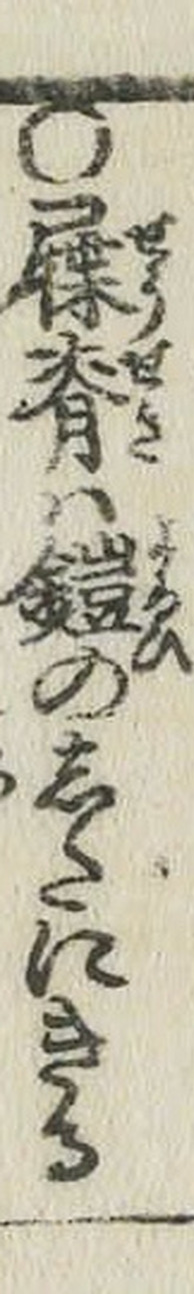○屧脊は鎧のしたにきる
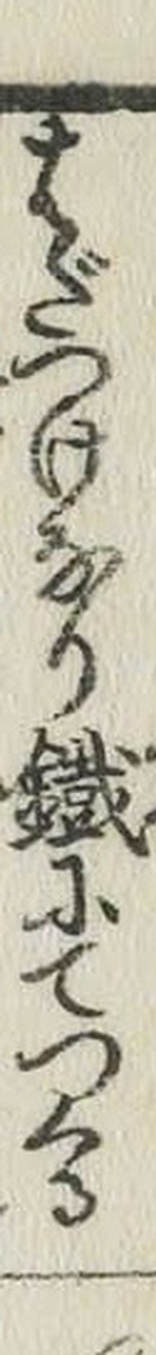はだつけなり鉄にてつくる
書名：増補頭書訓蒙図彙大成 10巻 5:巻之9-11
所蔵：東京学芸大学教育コンテンツアーカイブ
